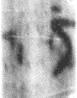可
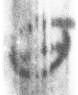缶
